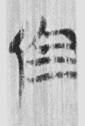於
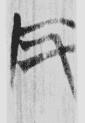厇
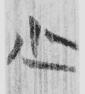少
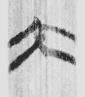大
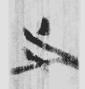之
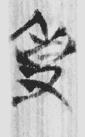事
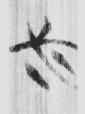必
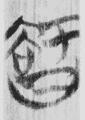智
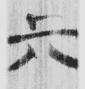亓
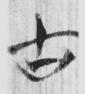古
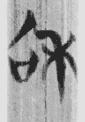和
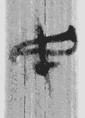民
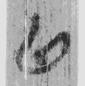㠯（以）
